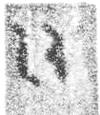川
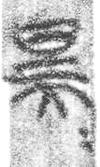昊昊
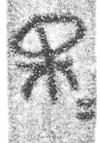冥冥
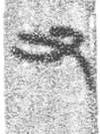又（有）
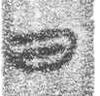日
